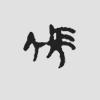倀
